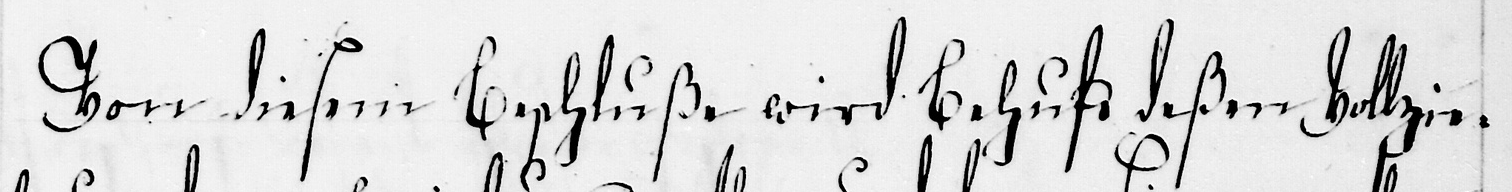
Von diesem Beschluße wird Behufs deßen Vollzie¬
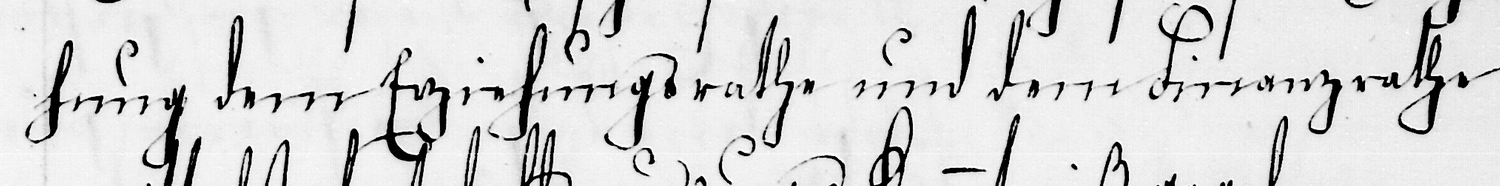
hung dem Erziehungsrathe und dem Finanzrathe
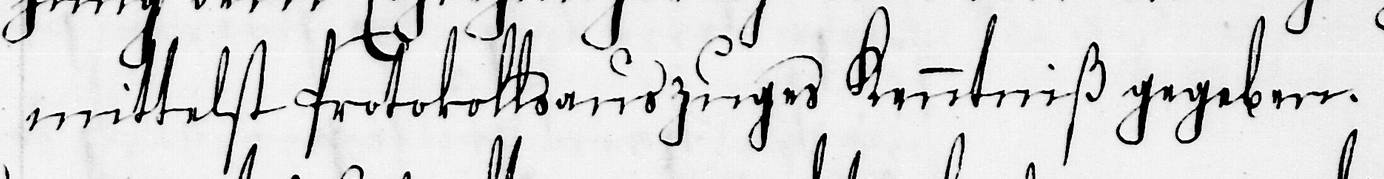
mittelst Protokollsauszuges Kenntniß gegeben.
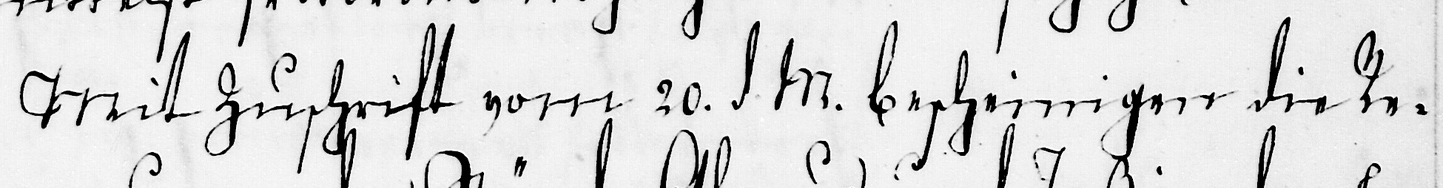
Mit Zuschrift vom 20. d. M. bescheinigen die Re¬
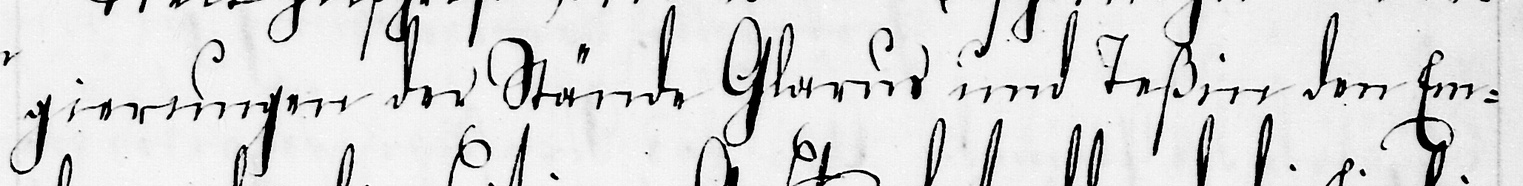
gierungen der Stände Glarus und Teßin den Em¬
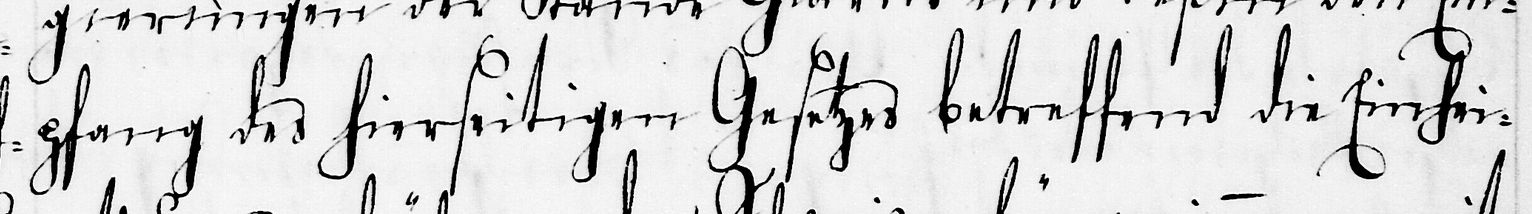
pfang des hierseitigen Gesetzes betreffend die Einh¬
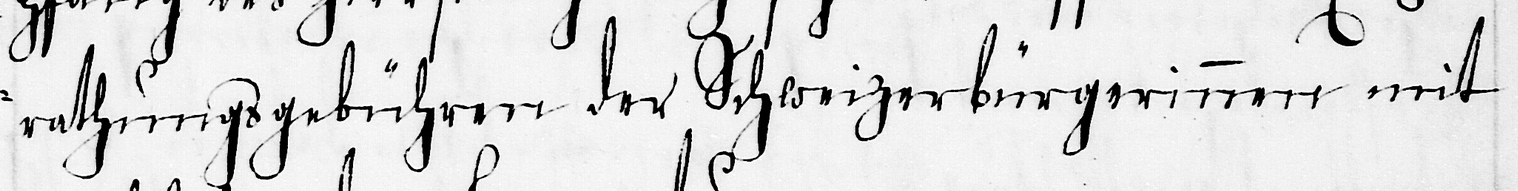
rathungsgebühren der Schweizerbürgerinnen mit
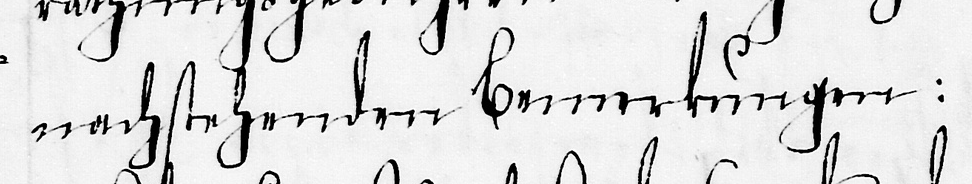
nachstehenden Bemerkungen:
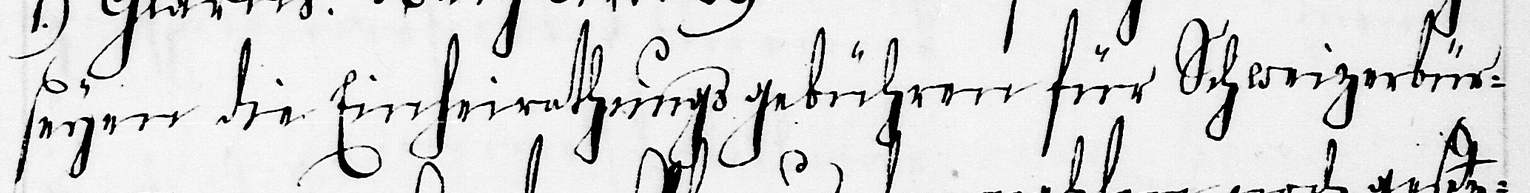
seyen die Einheirathungsgebühren für Schweizerbür¬
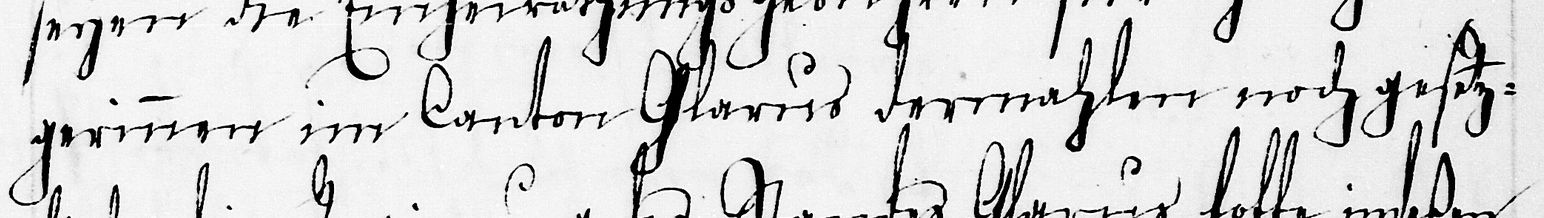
gerinnen im Canton Glarus dermahlen noch gesetz¬
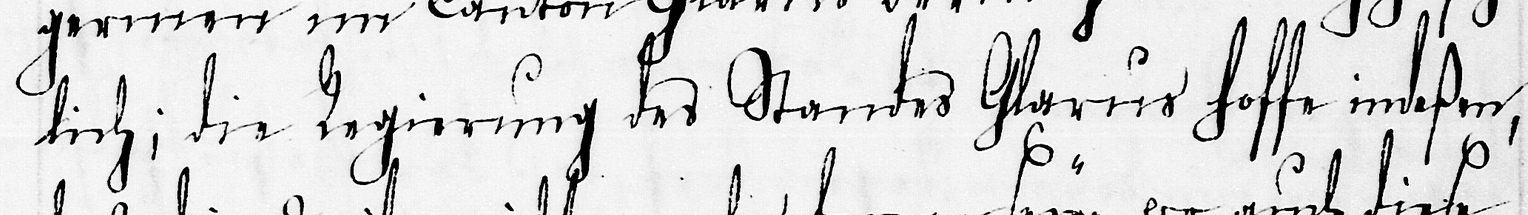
lich; die Regierung des Standes Glarus hoffe indeße¬
